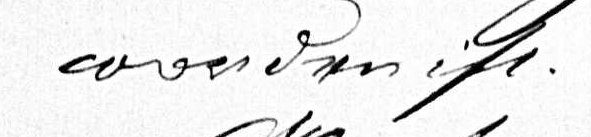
worden ist.
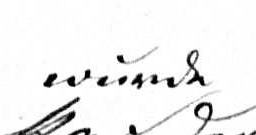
Wurde
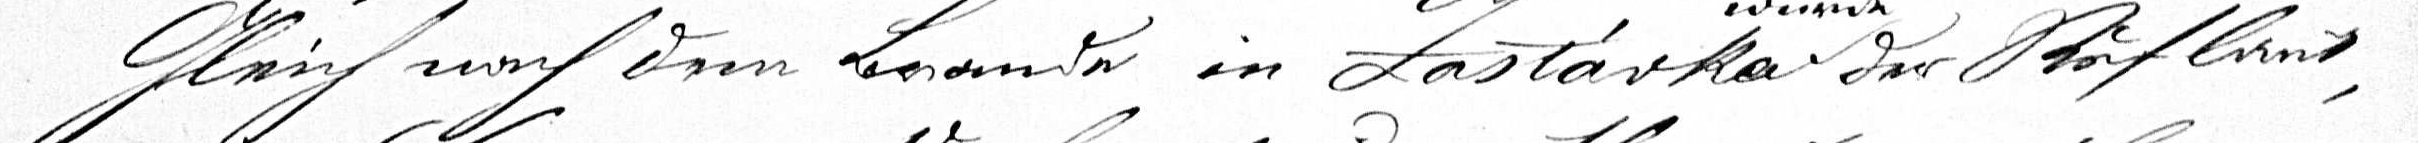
Gleich nach dem Brande in Zastávka der Rusland,
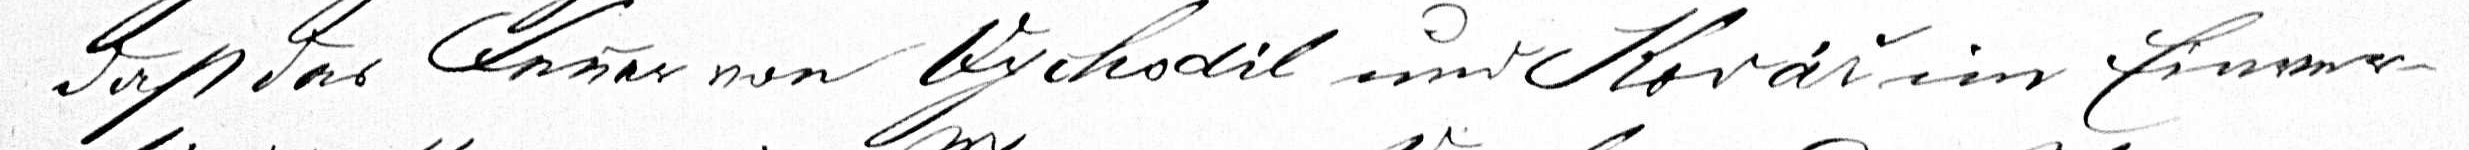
daß das Feuer von Vychodil und Kovár im Einver¬
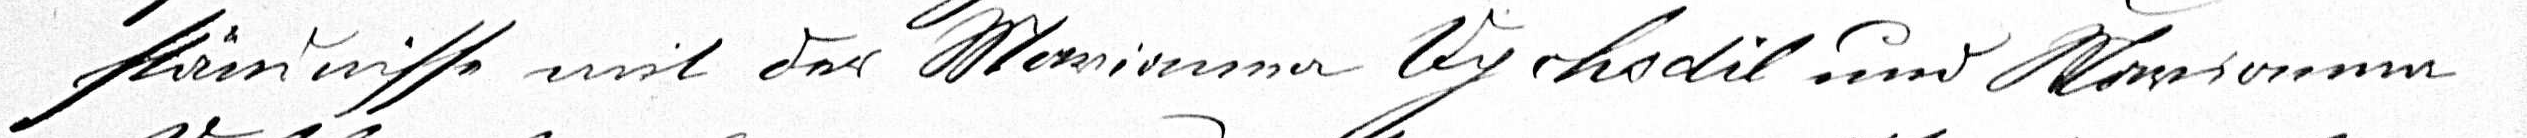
ständnisse mit der Marianna Vychodil und Marianna
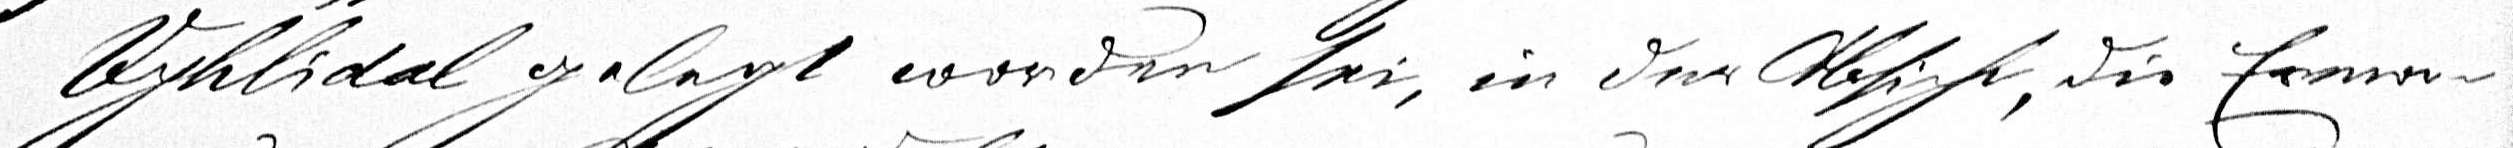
Vyhlidal gelegt worden sei, in der Absicht, die Ermor¬
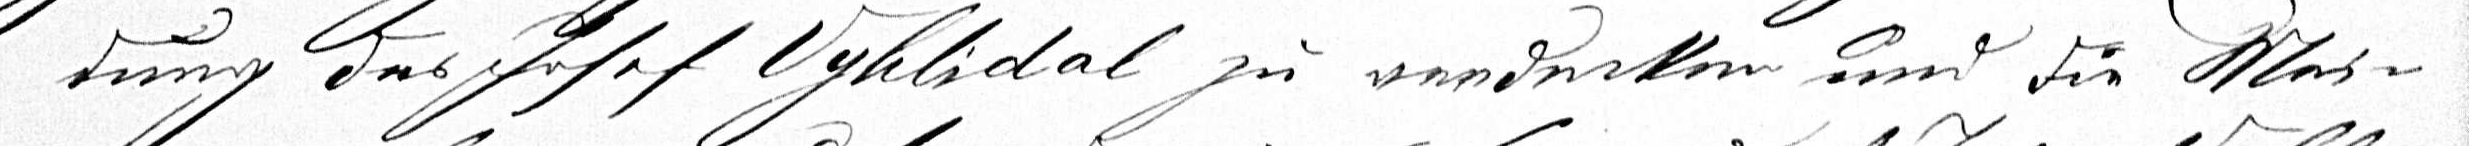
dung des Josef Vyhlidal zu verdecken und die Mei¬
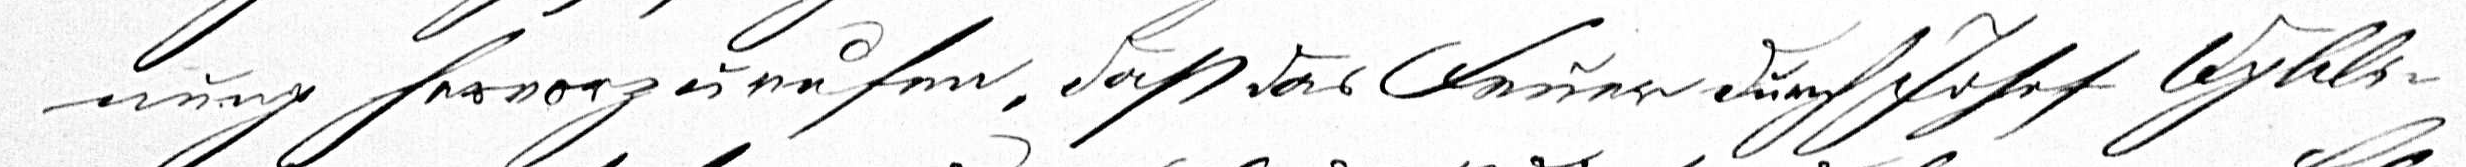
nung hervorzurufen, daß das Feuer durch Josef Vyhli¬
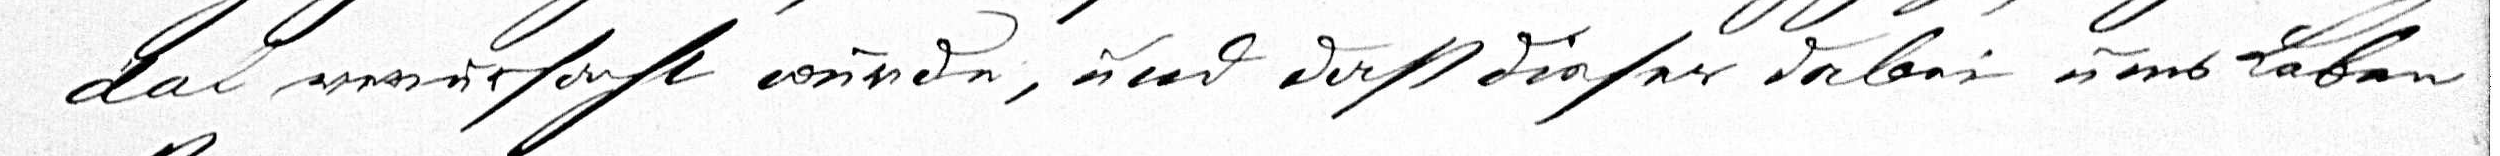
dal verursacht wurde, und daß dieser dabei ums Leben
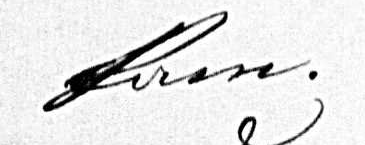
kam.
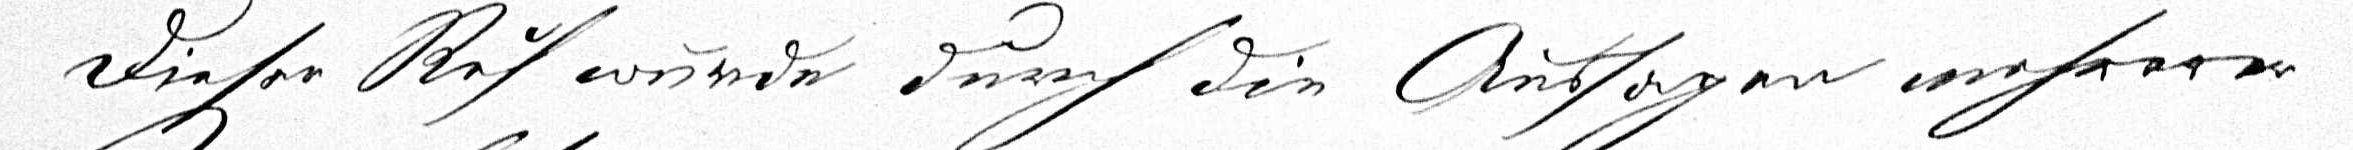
Dieser Ruf wurde durch die Aussagen mehrerer
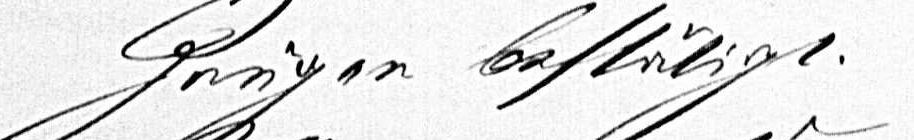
Zeugen bestätigt.
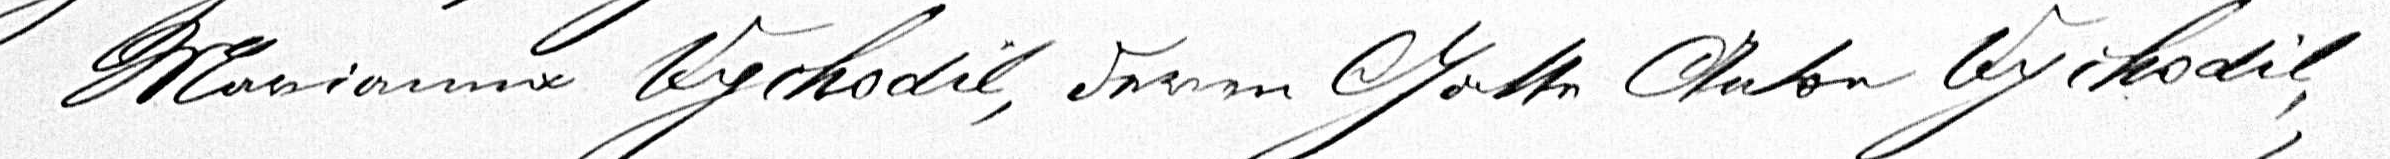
Marianna Vychodil, deren Gatte Anton Vychodil,
